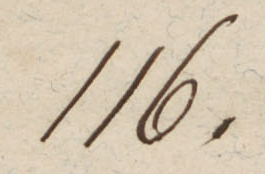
116.
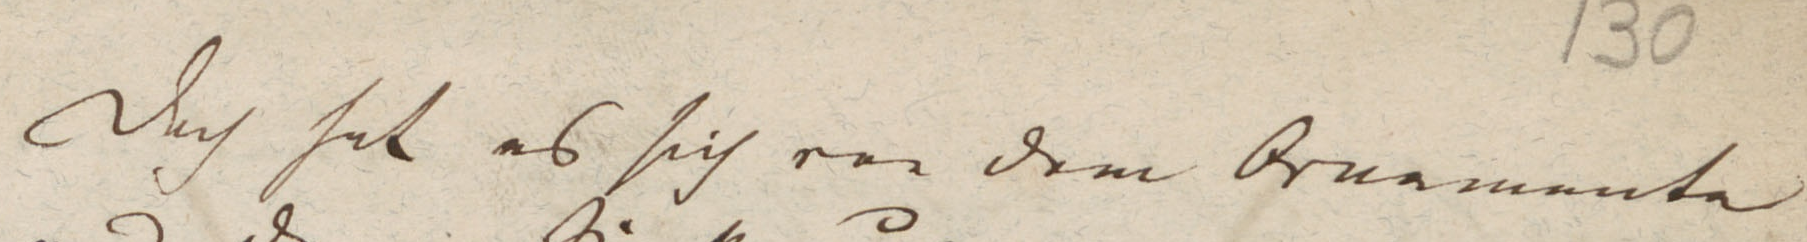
Doch hat es sich von dem Ornamente
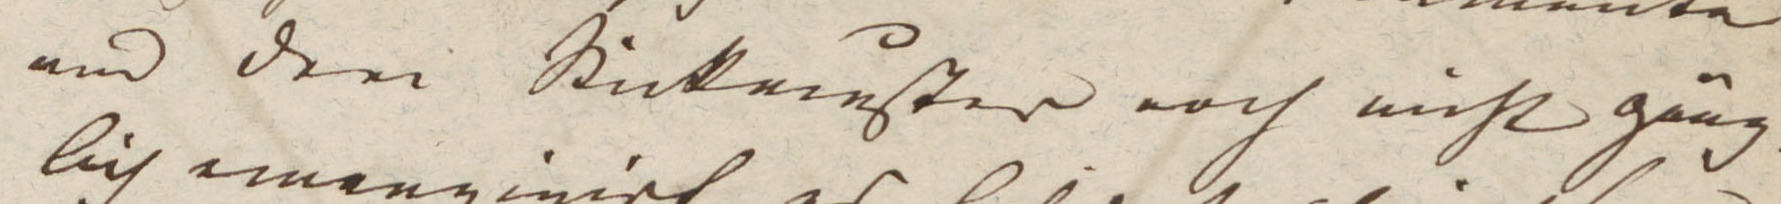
und dem Stickmuster noch nicht gänz-
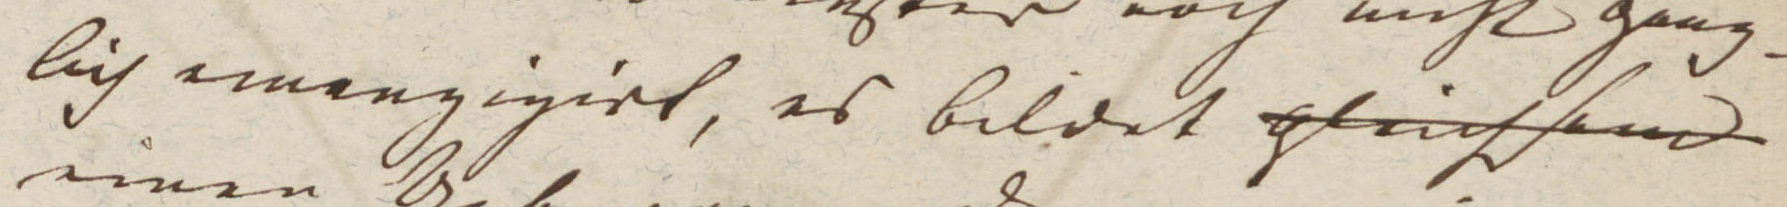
lich emanzipirt, es bildet gleichsam
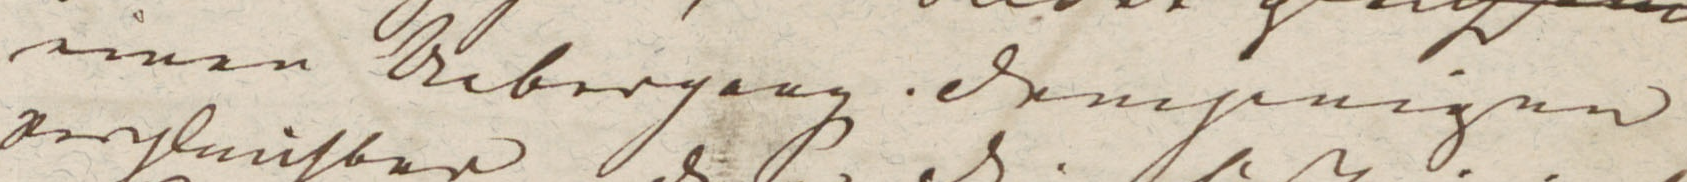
einen Uebergang demjenigen
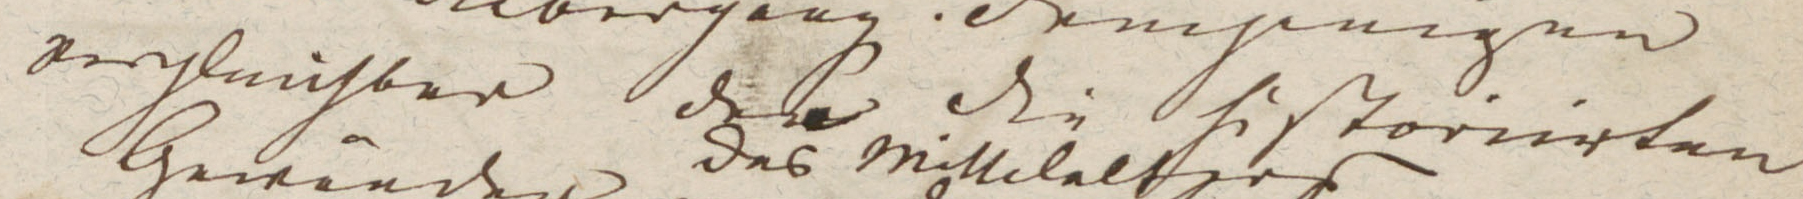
vergleichbar den die historiirten
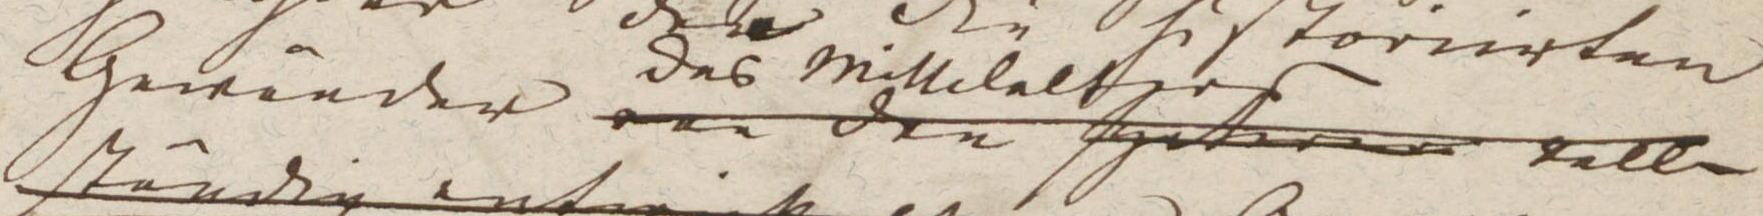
Gewänder von den später voll-
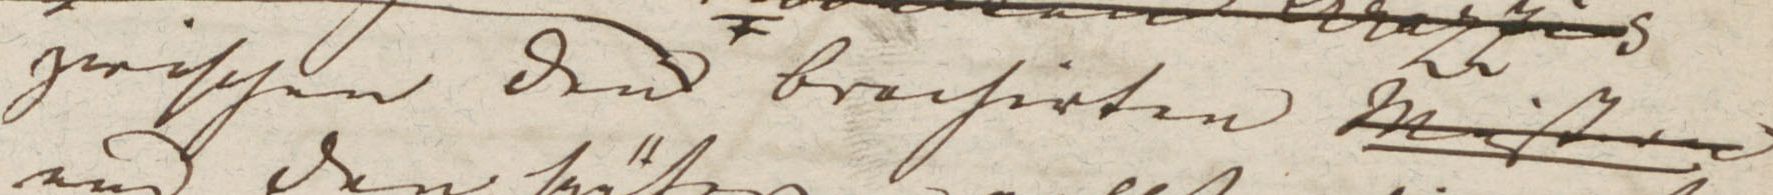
zwischen den % brochirten Meistern
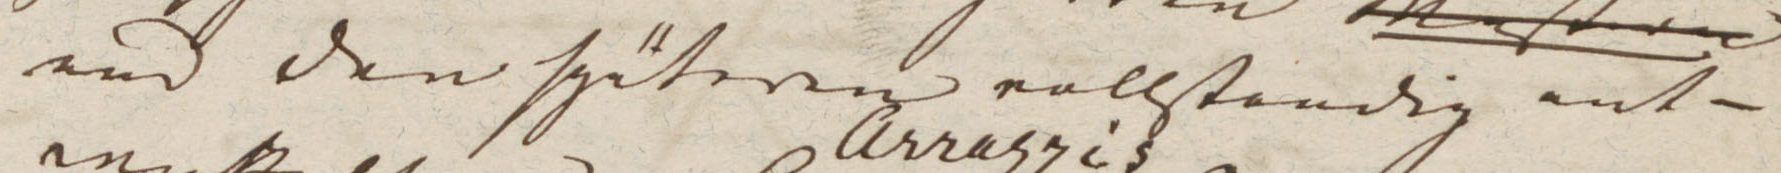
und den späteren vollstandig ent-
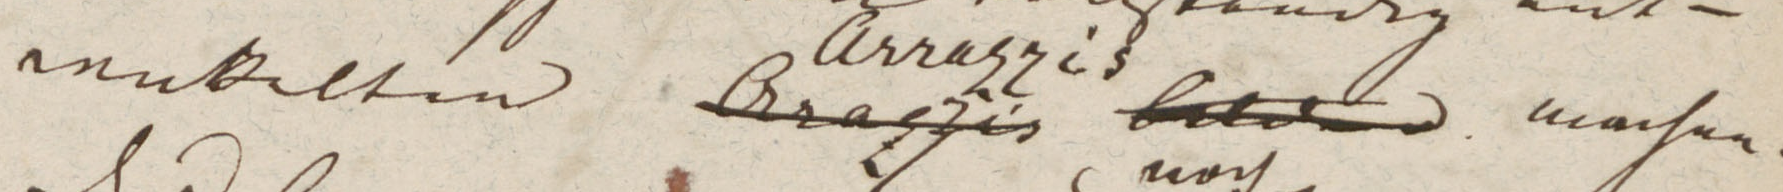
wickelten Arazzis Arazzis bilden machen.
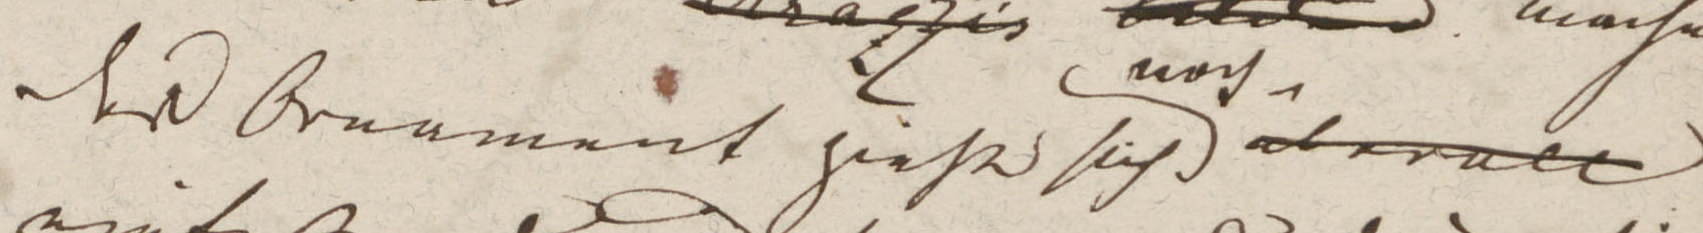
Das Ornament zieht sich noch überall
